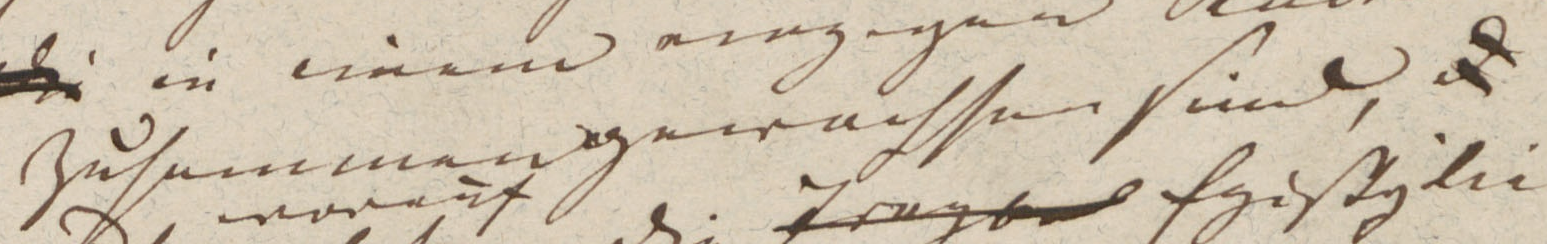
zusammengewachsen sind, d
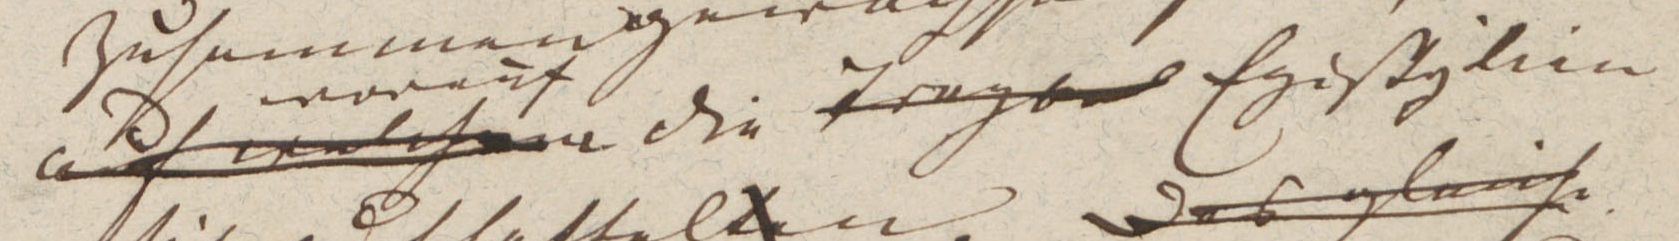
auf welchem worauf die Tragb Epistylien
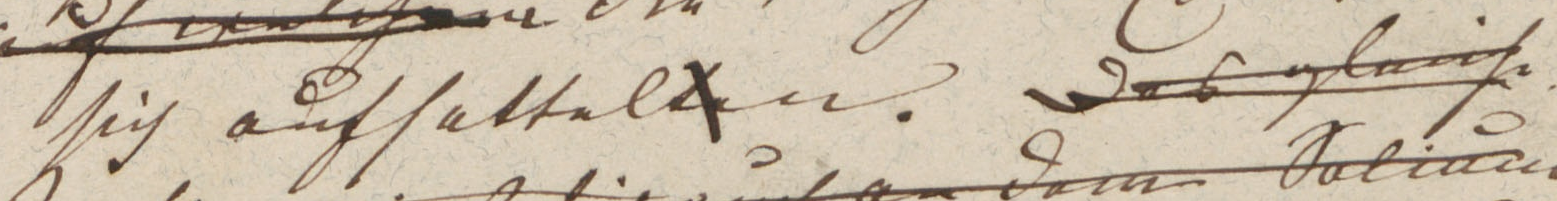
sich aufsattelten. Das gleiche
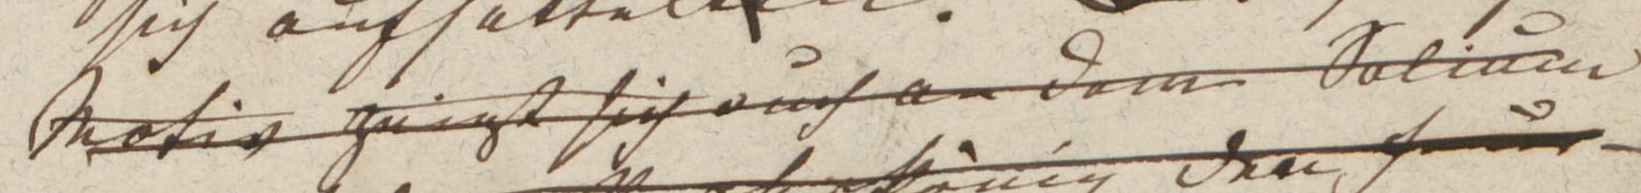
Motiv zeigt sich auch an dem Solium
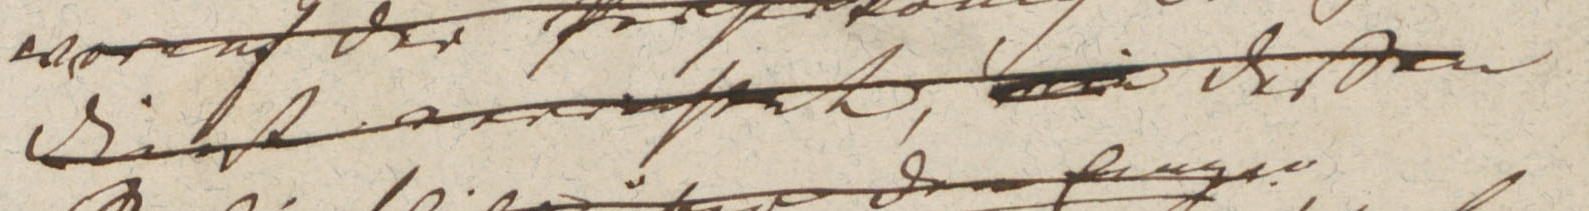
dienst verrechnet, wie dessen
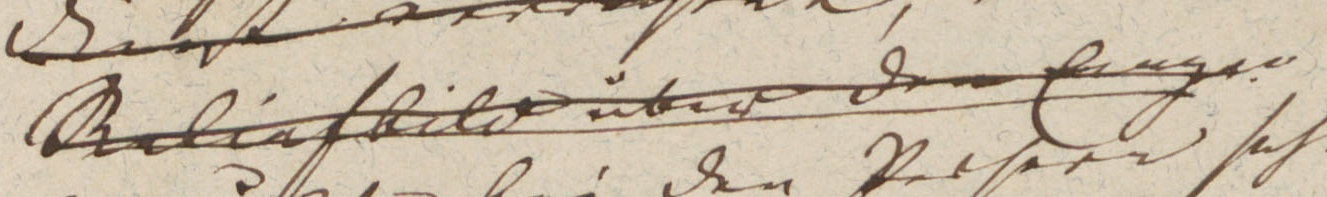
Reliefbild über den Eingan
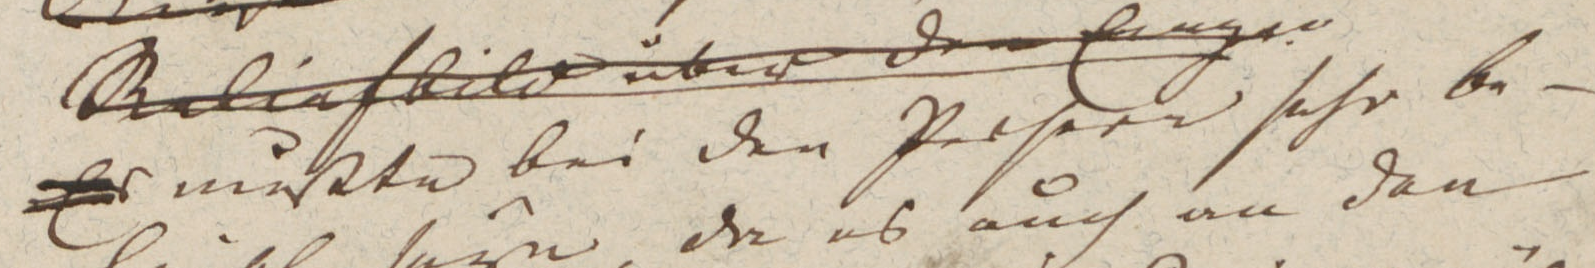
Es musste bei den Persern sehr be-
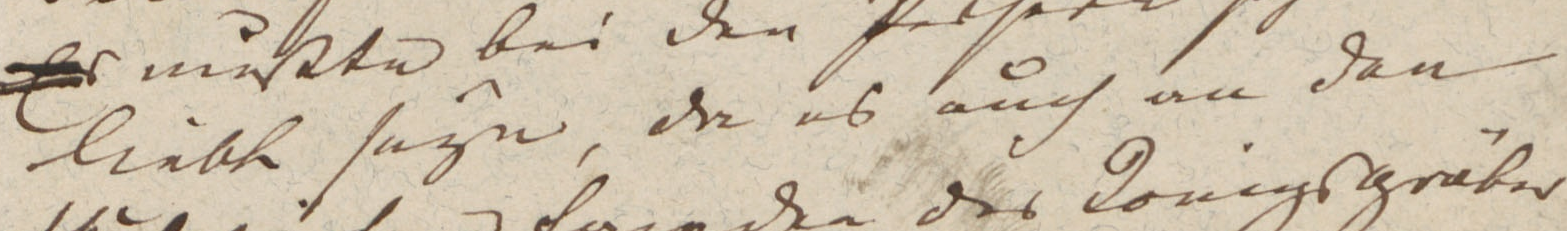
liebt seyn, da es auch an den
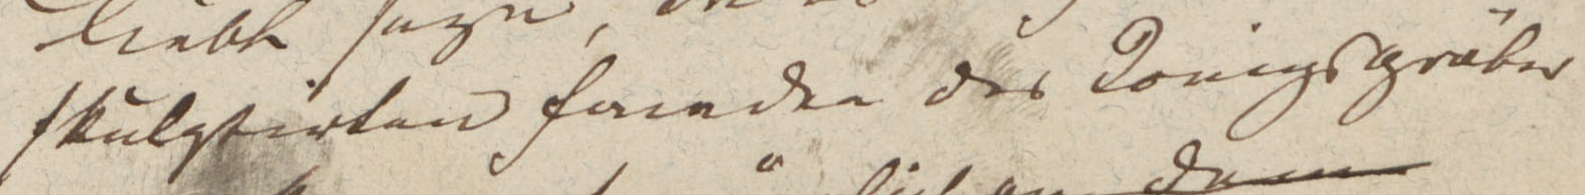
skulptirten Facaden der Konigsgräber
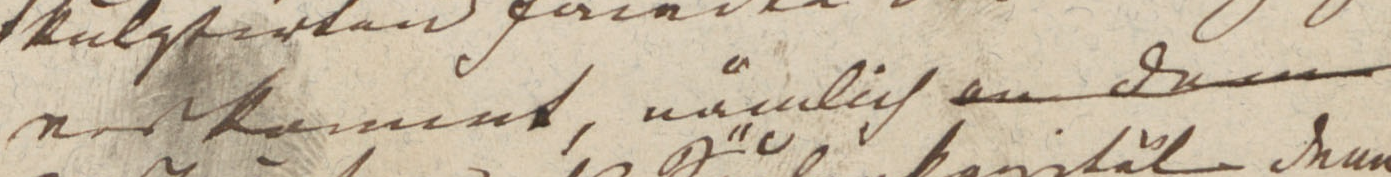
vorkommt, nämlich an dem
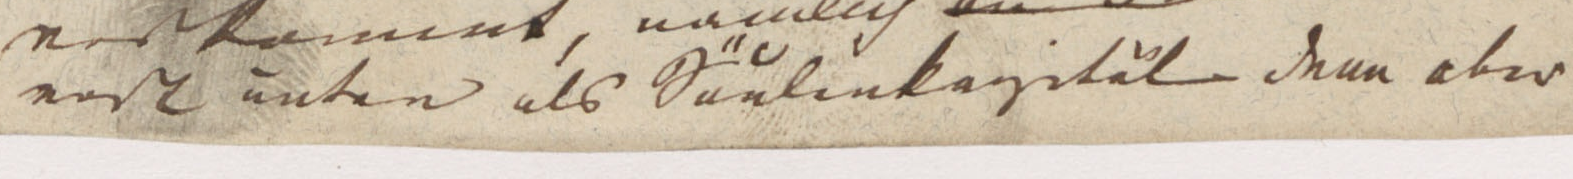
erst unten als Säulenkapitäl dann aber
